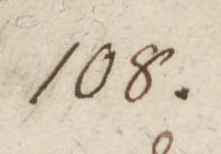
108.
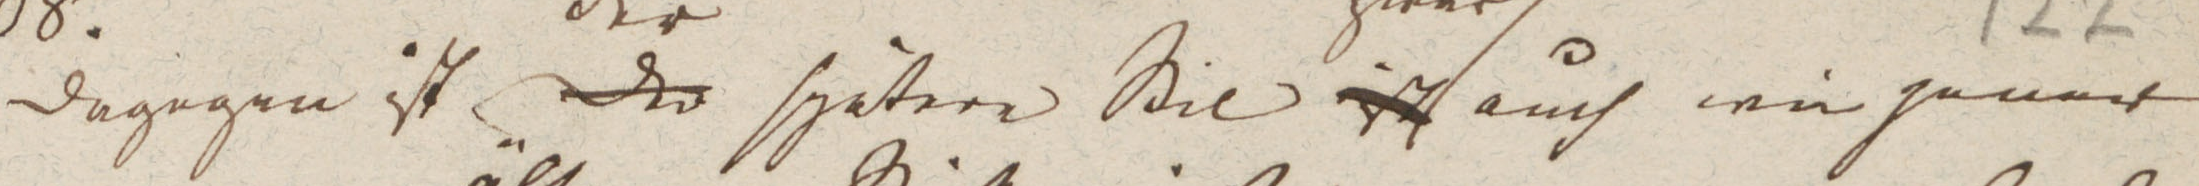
Dagegen ist Der der spätere Stil ist zwar auch wie jener
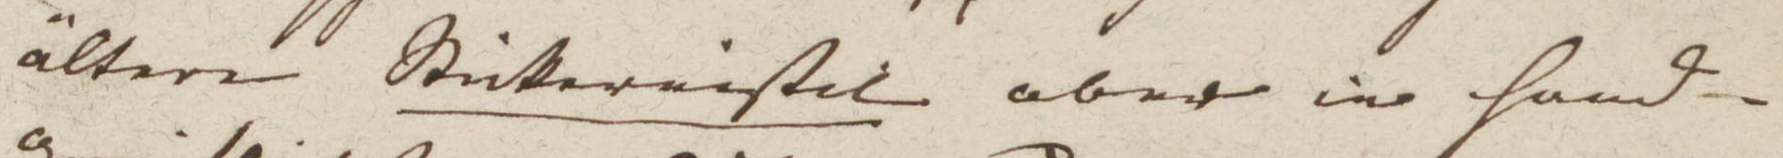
ältere Stickeristil aber in hand-
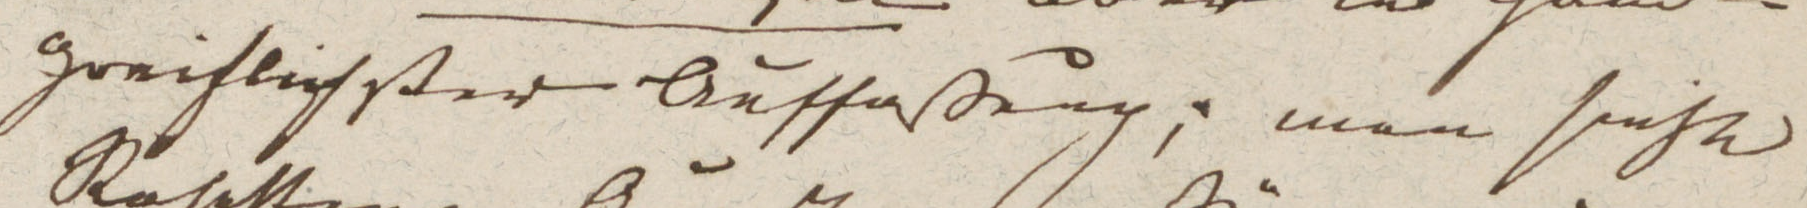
greiflichster Auffassung; man sieht
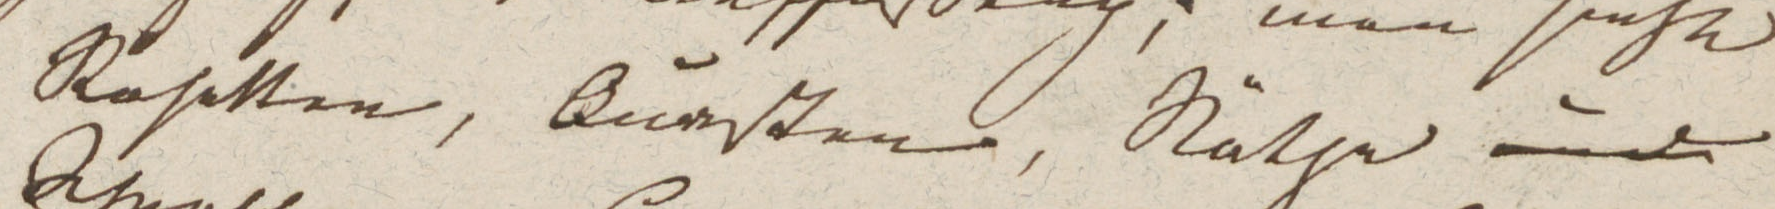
Rosetten, Auasten, Näthe und
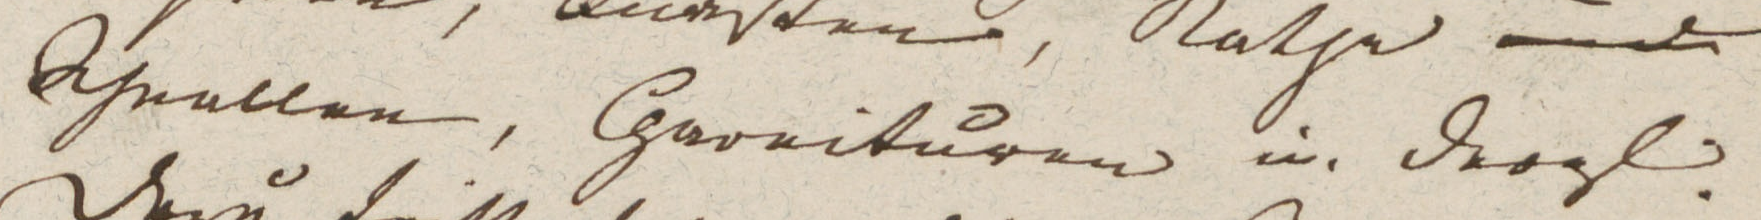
Schnallen, Garnituren u. dergl.
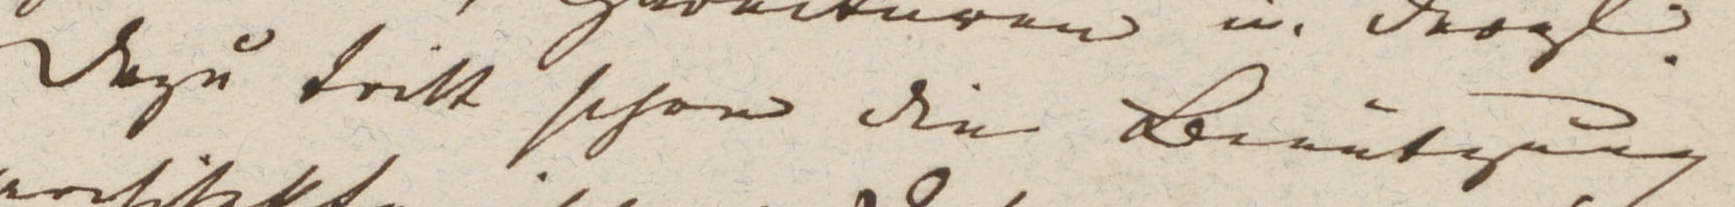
Dazu tritt schon die Benützung
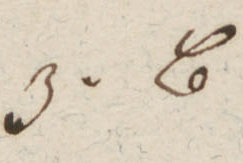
z. B.
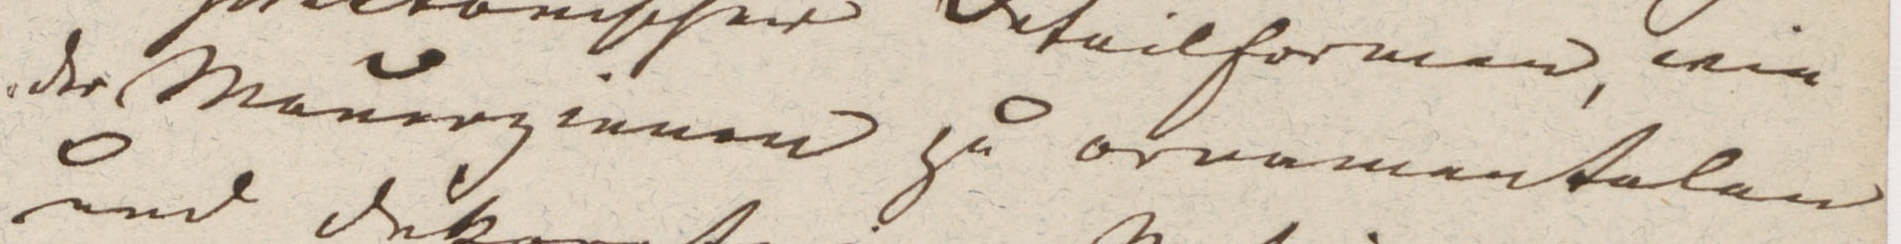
der Mauerzinnen zu ornamentalen
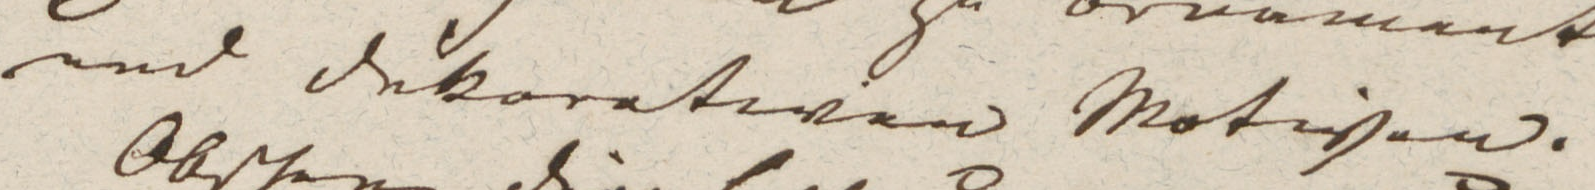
und dekorativen Motiven.
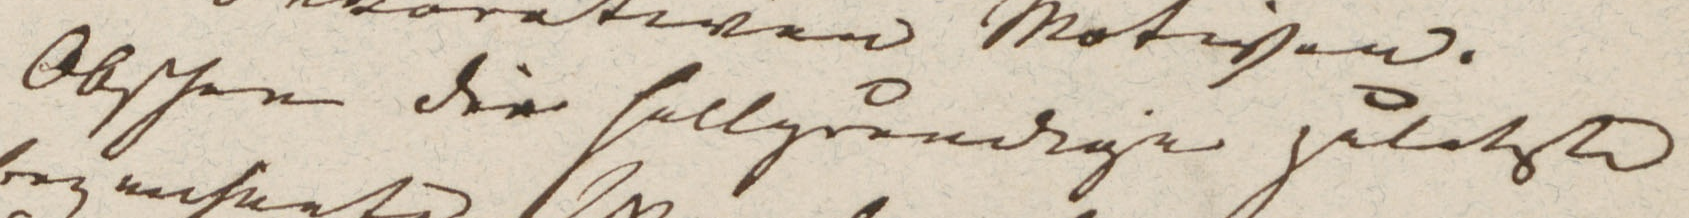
Obschon die hellgrundige zuletzt
